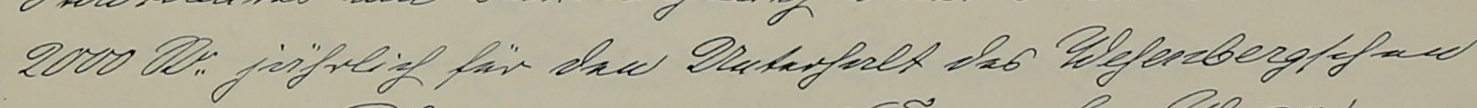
2000 Ro. jährlich für den Unterhalt des Wesenbergschen
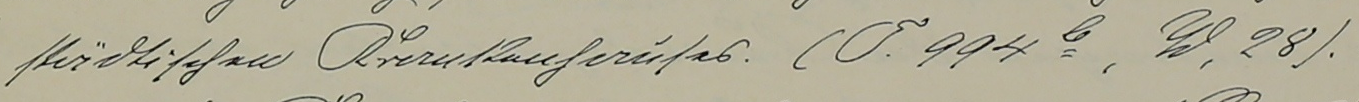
städtischen Krankenhauses (T.994b , W.28).
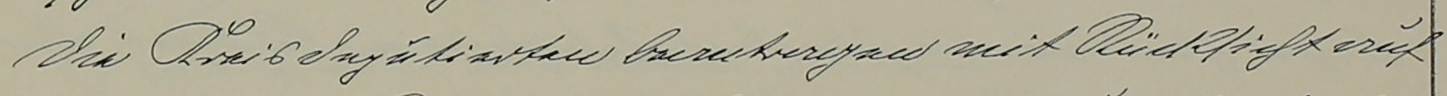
Die Kreisdeputierten beantragen mit Rücksicht auf
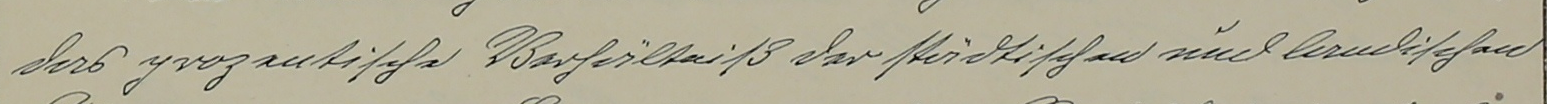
das prozentige Verhältniß der städtischen und landischen
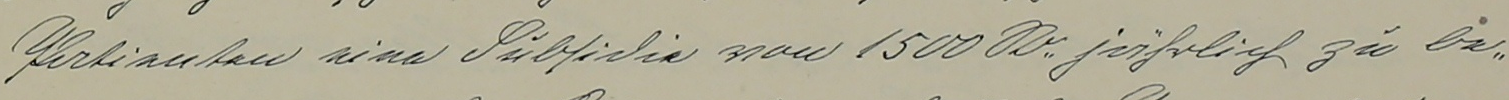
Patienten eine Subsidie von 1500 Ro. jährlich zu be-
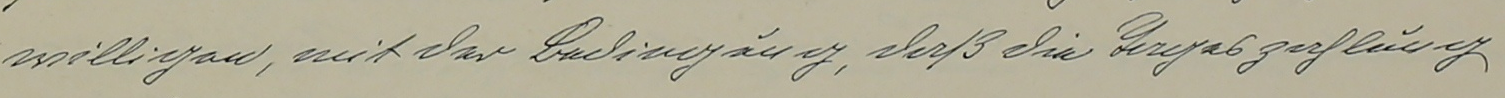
willigen, mit der Bedingung, daß die Tageszahlung
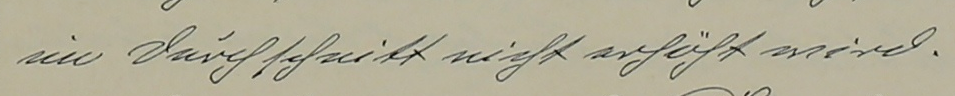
im Durchschnitt nicht erhöht wird.
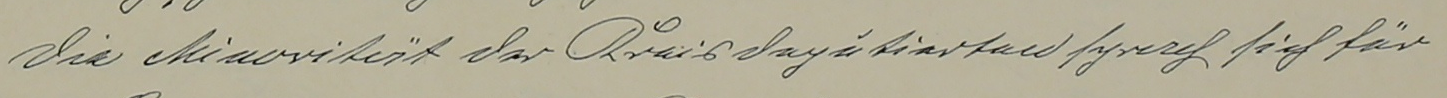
Die Minorität der Kreisdeputierten sprach sich für
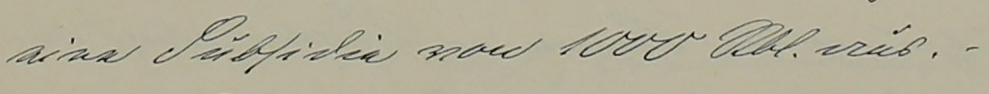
eine Subsidie von 1000 Rbl. aus.
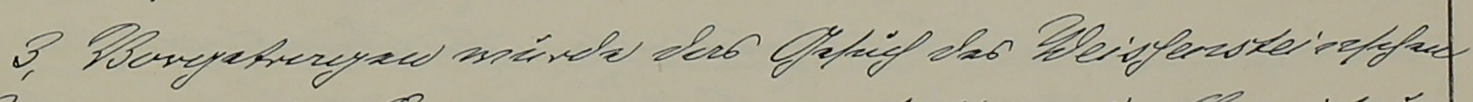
3. Vorgetragen wurde das Gesuch des Weissensteinschen
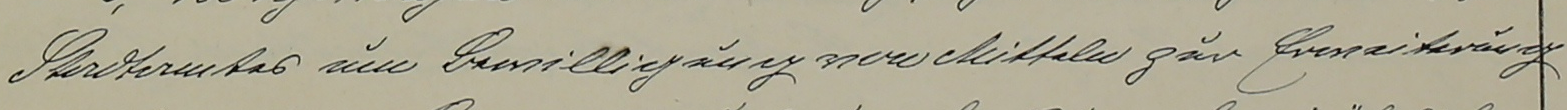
Stadtamtes um Bewilligung von Mitteln zur Erweiterung
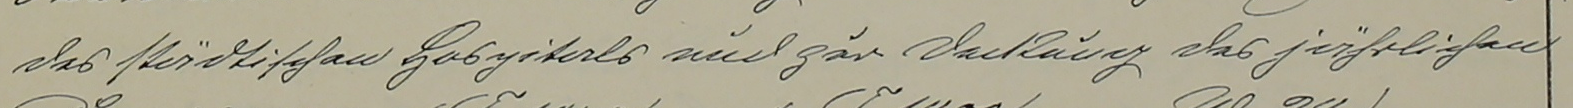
des städtischen Hospitals und zur Deckung des jährlichen
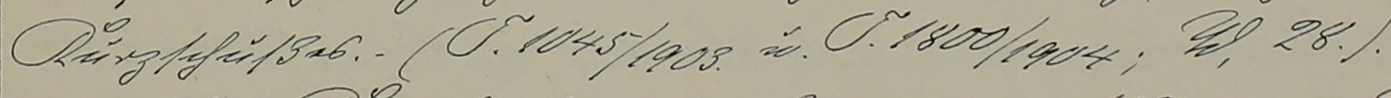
Kurzschußes. - (T.1045/1903. u. T.1800/1904; W.28).
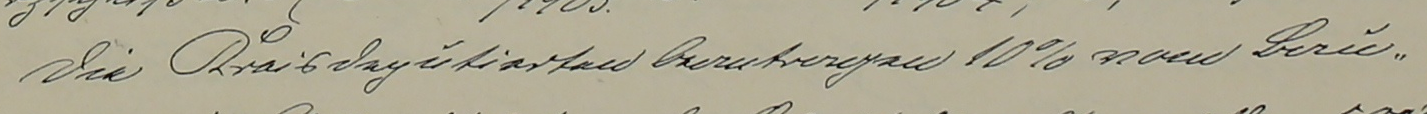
Die Kreisdeputierten beantragen 10 % vom Bau-
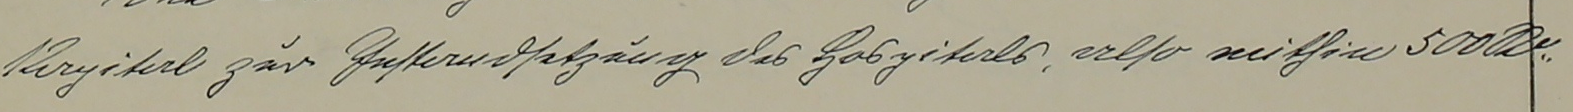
kapital zur Instandsetzung des Hospitals, also mithin 500 Ro.
